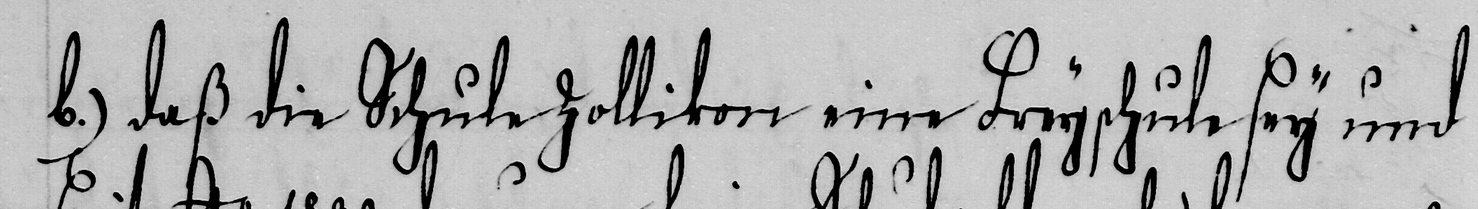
b.) daß die Schule Zollikon eine Freyschule und
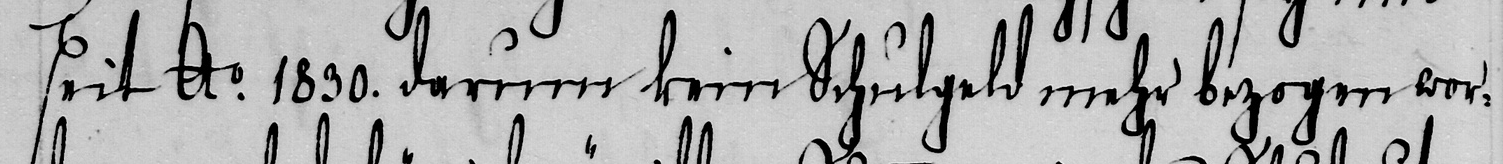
seit Ao. 1830. darum kein Schulgeld mehr bezogen wor¬
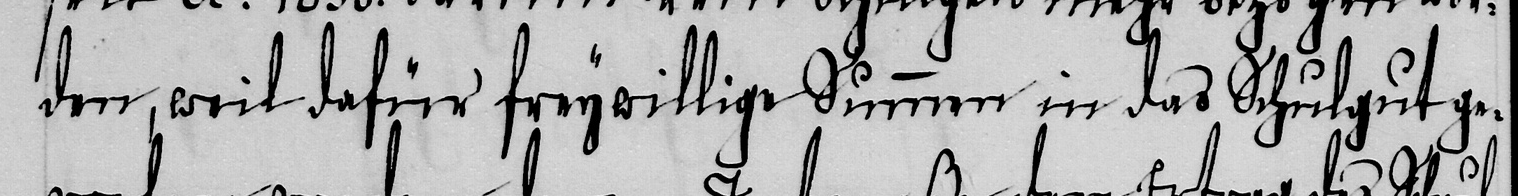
den, weil dafür freywillige Summen in das Schulgut g¬
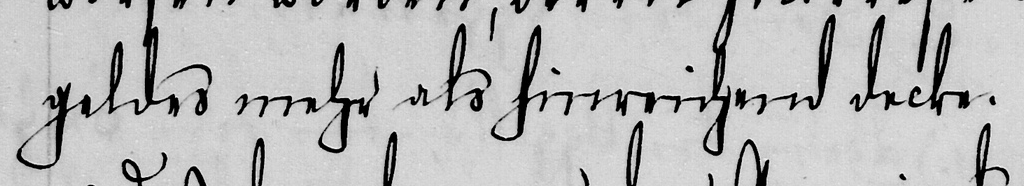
geldes mehr als hinreichend decke.
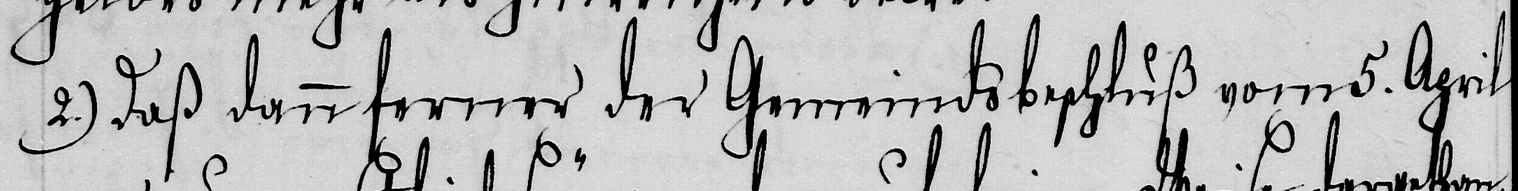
2.) Daß dann ferner der Gemeindsbeschluß vom 5. April
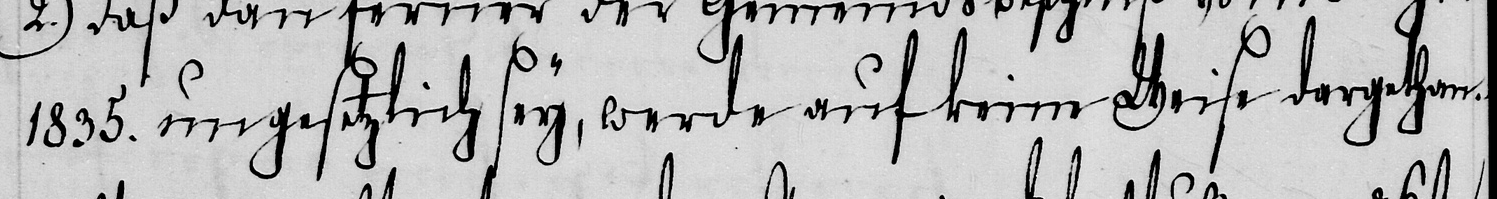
1835. ungesetzlich sey, werde auf keine Weise dargethan.
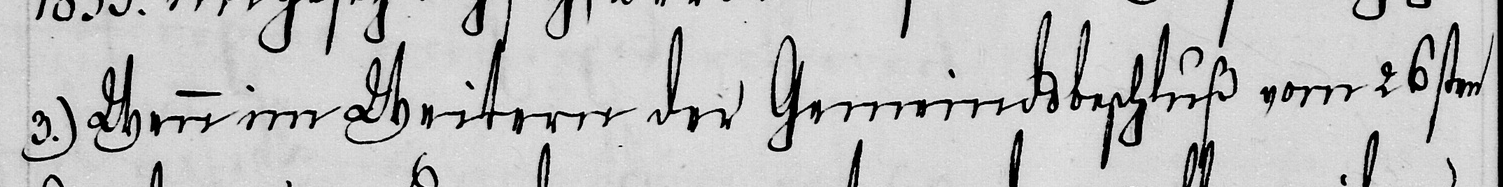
3.) Wenn im Weitern der Gemeindsbeschluß vom 26sten
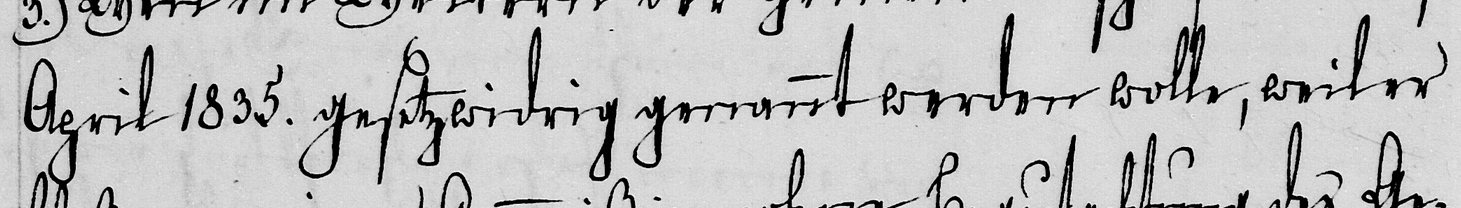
April 1835. gesetzwidrig genannt werden wolle, weil er
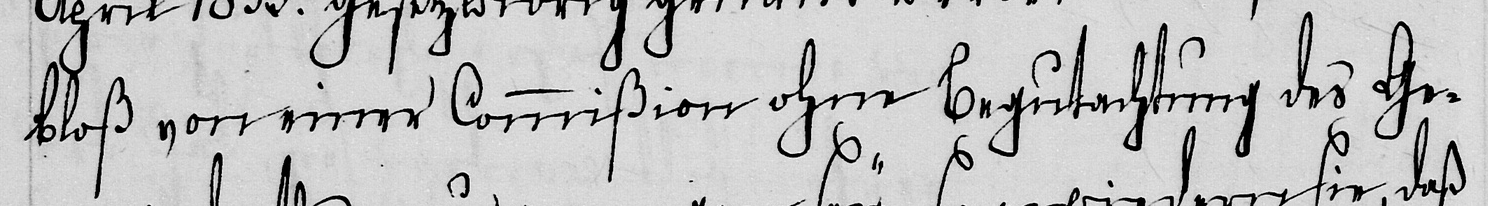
bloß von einer Commißion ohne Begutachtung des Ge¬
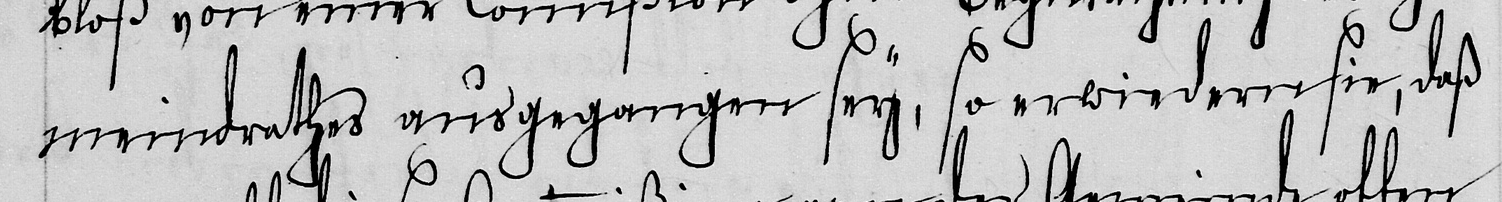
meindrathes ausgegangen sey, so erwiedern sie, daß
